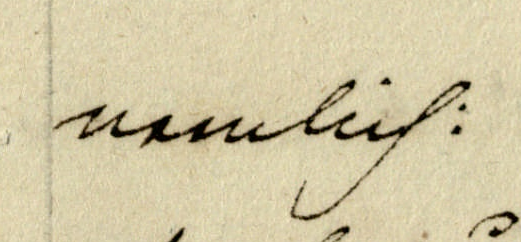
nemlich:
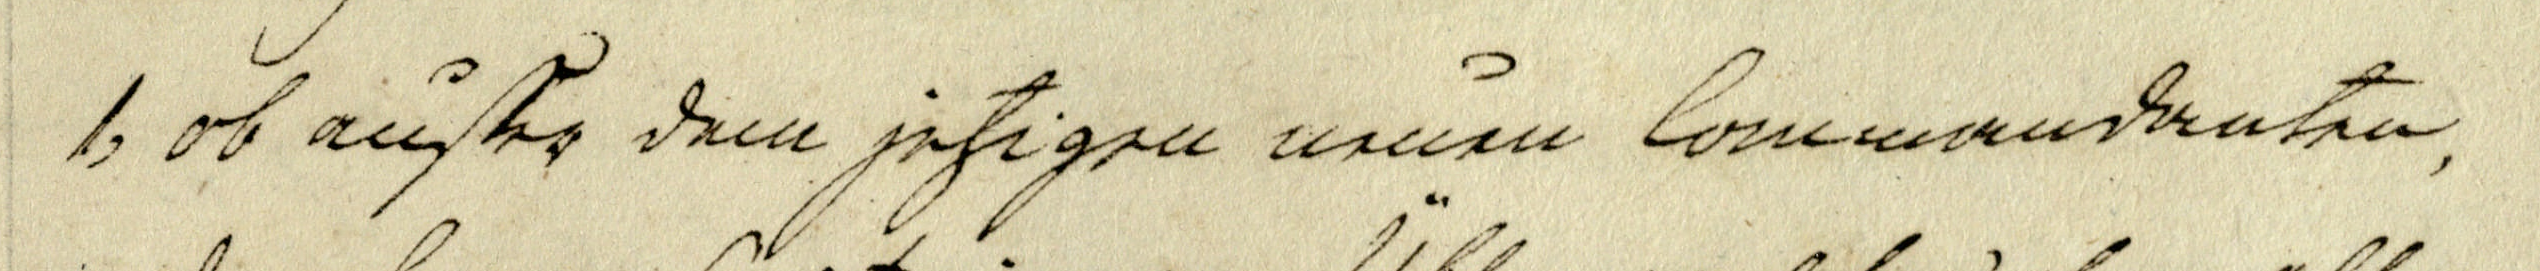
1., ob ausser dem jetzigen neuen Commandanten,
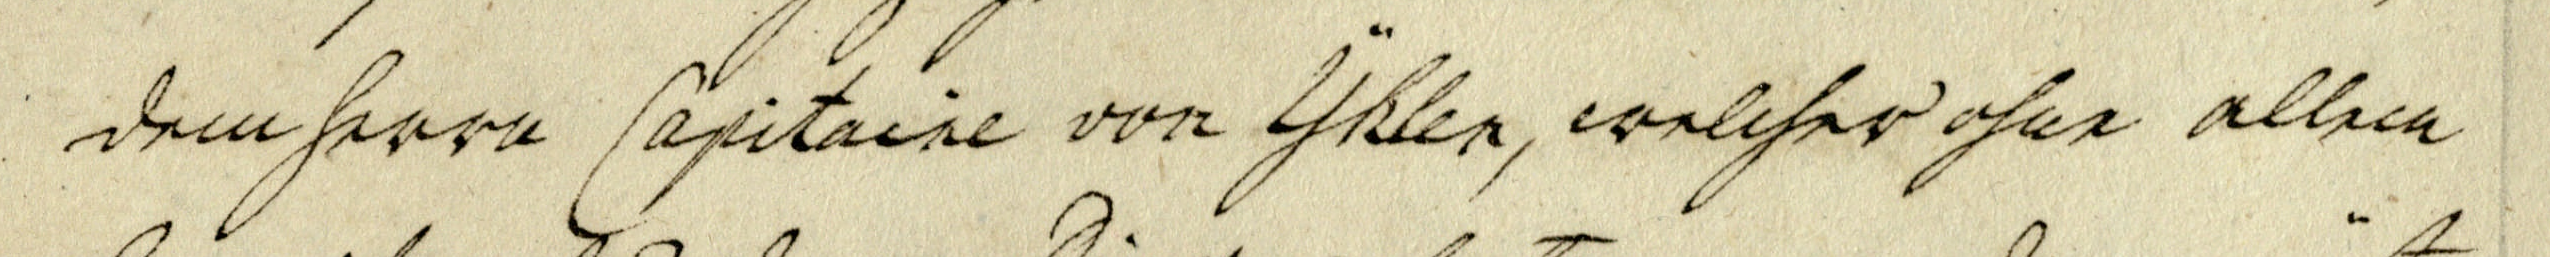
dem Herrn Capitaine von Yhlen, welcher ohne allen
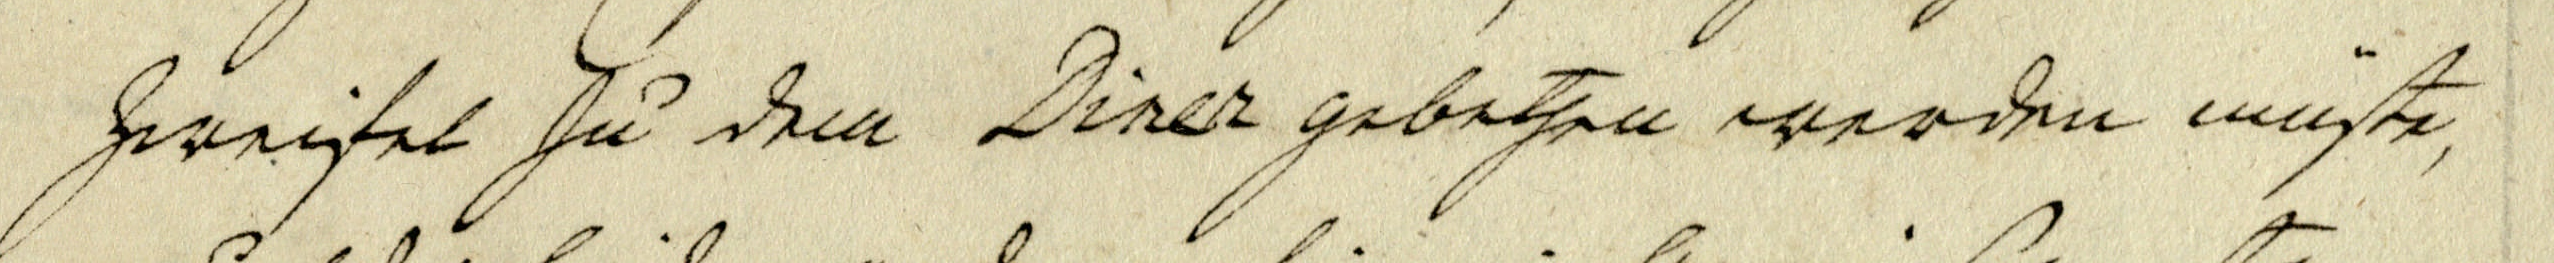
Zweifel zu dem Diner gebethen werden müßte,
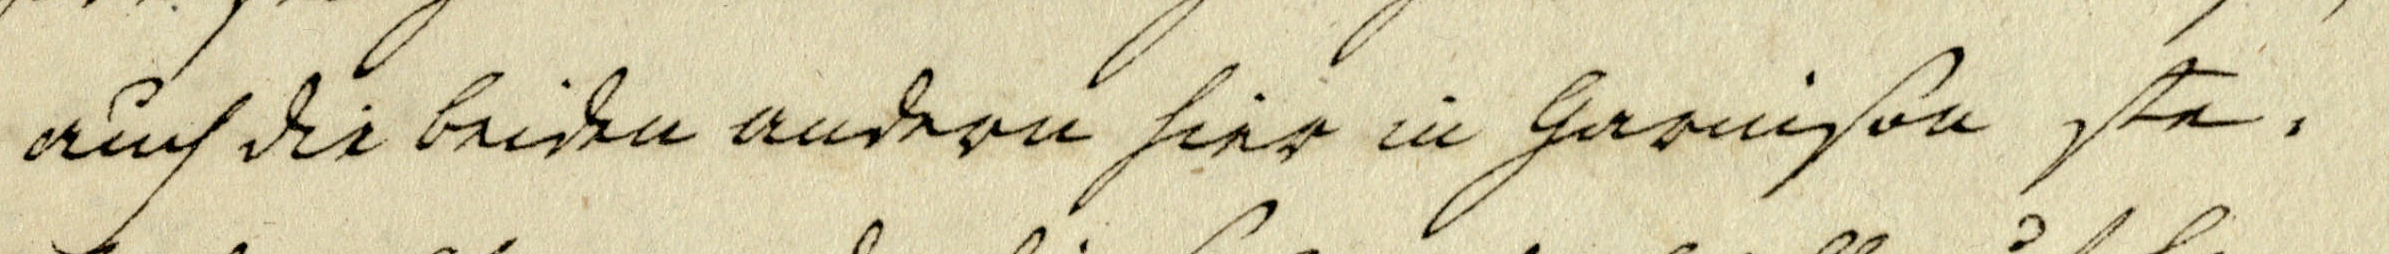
auch die beiden andern hier in Garnison ste¬
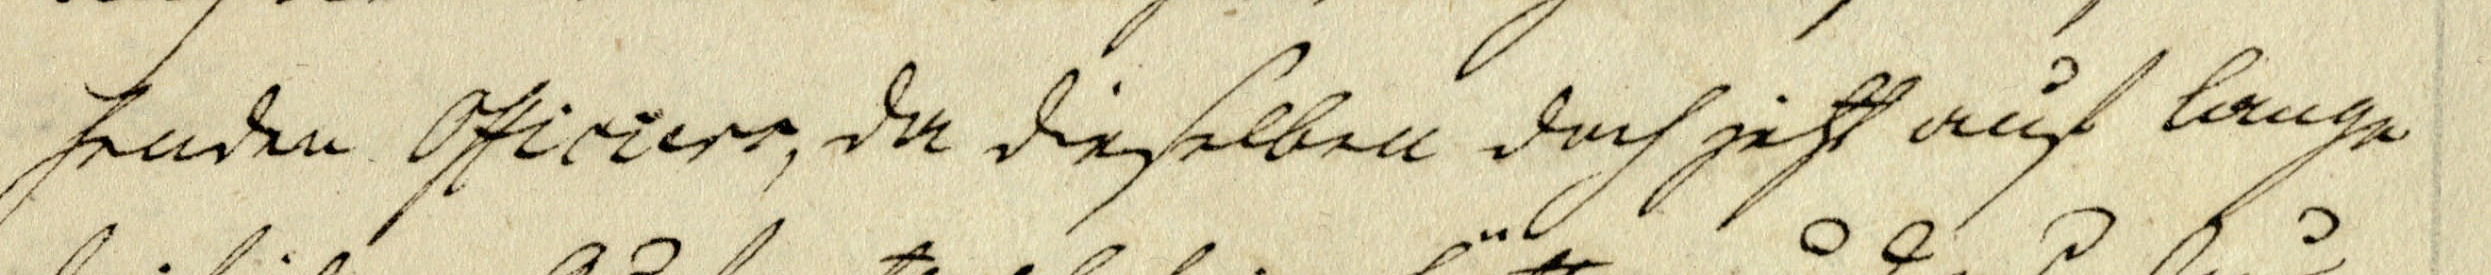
henden Officiers, da dieselben doch jetzt auf lange
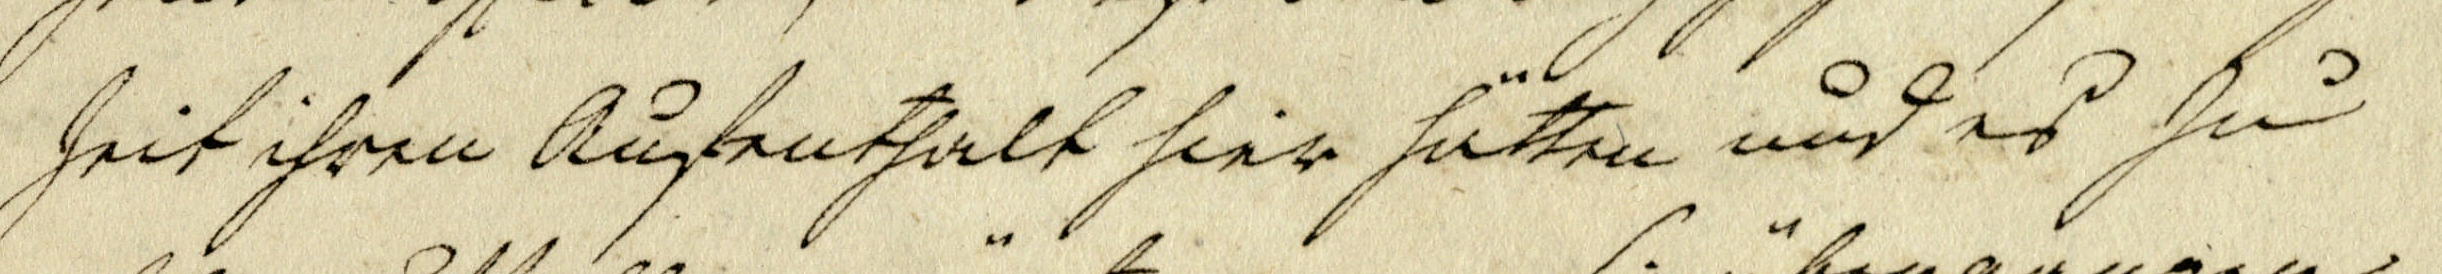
Zeit ihren Aufenthalt hier hätten und es zu
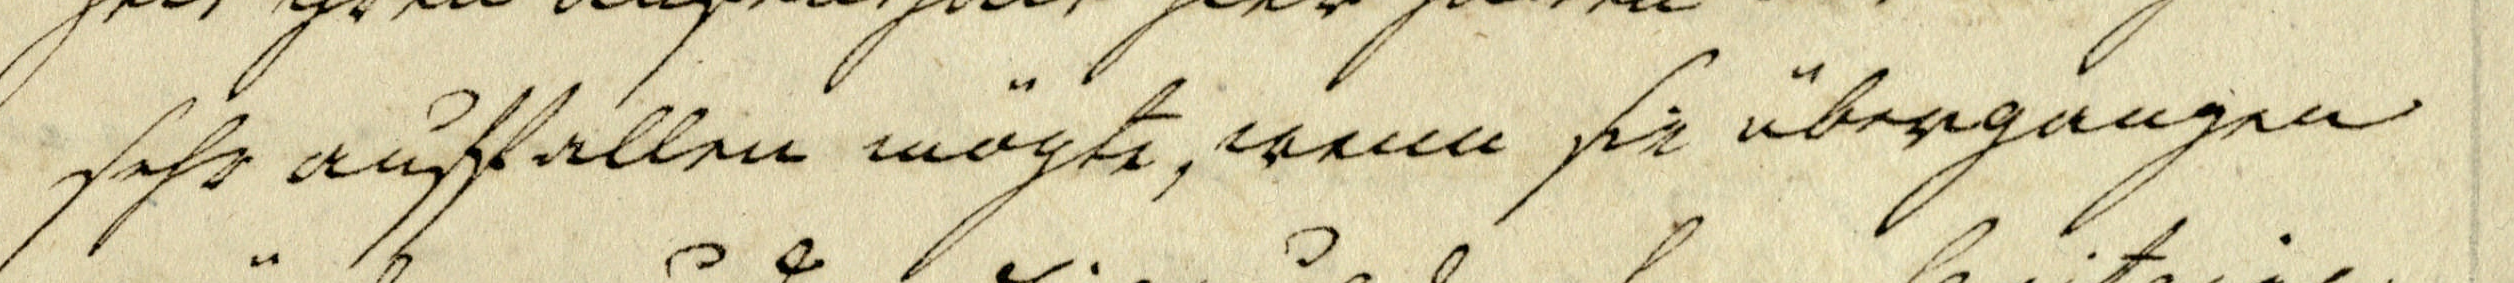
sehr auffallen mögte, wenn sie übergangen
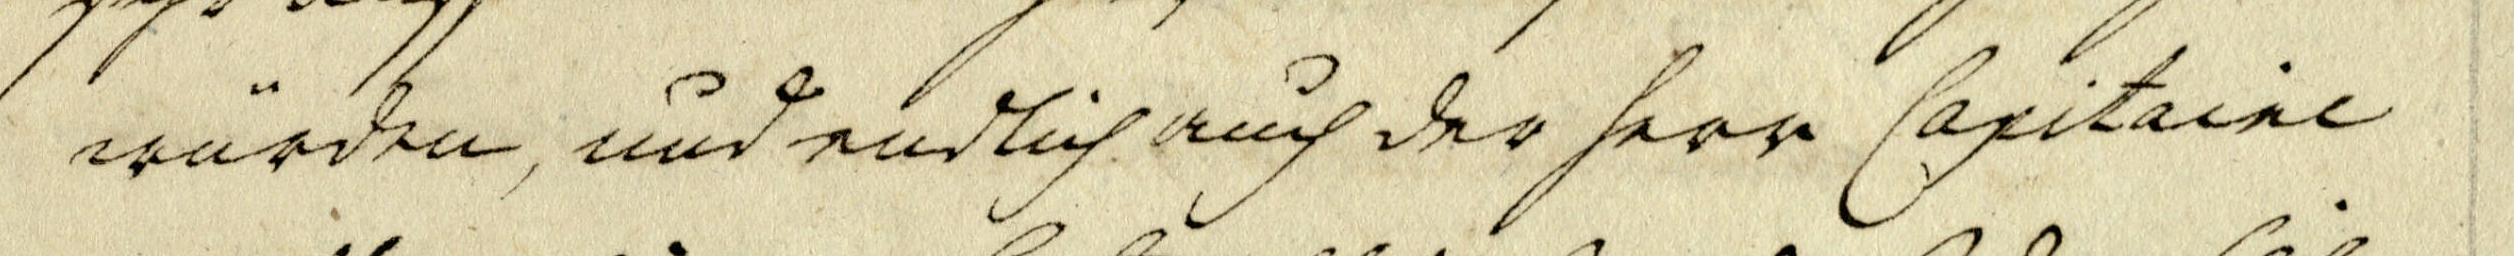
würden, und endlich auch der Herr Capitaine
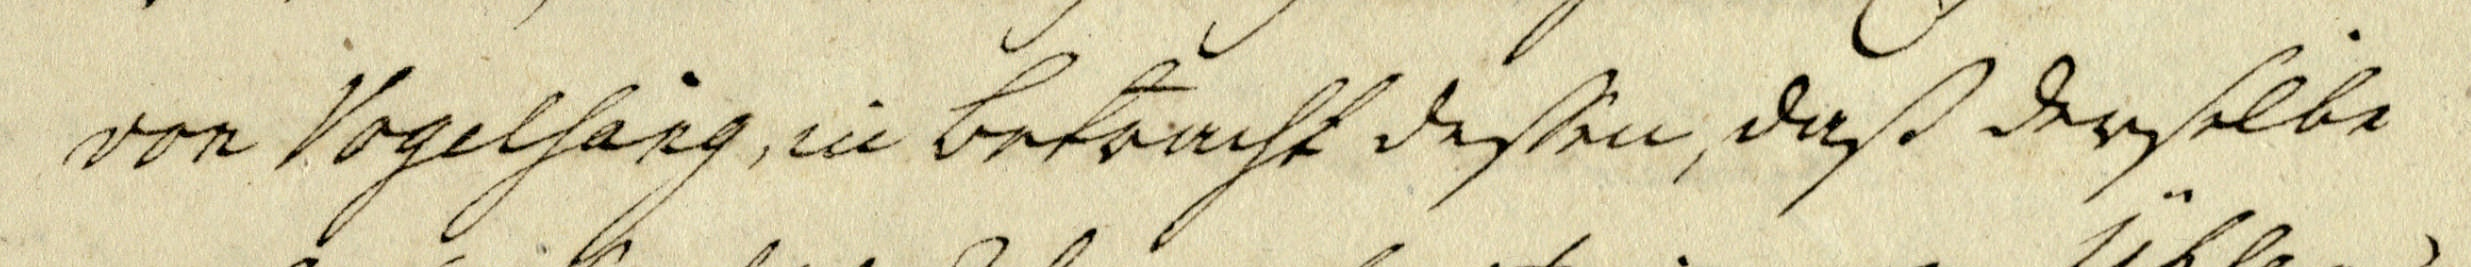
von Vogelsang, in Betracht dessen, daß derselbe
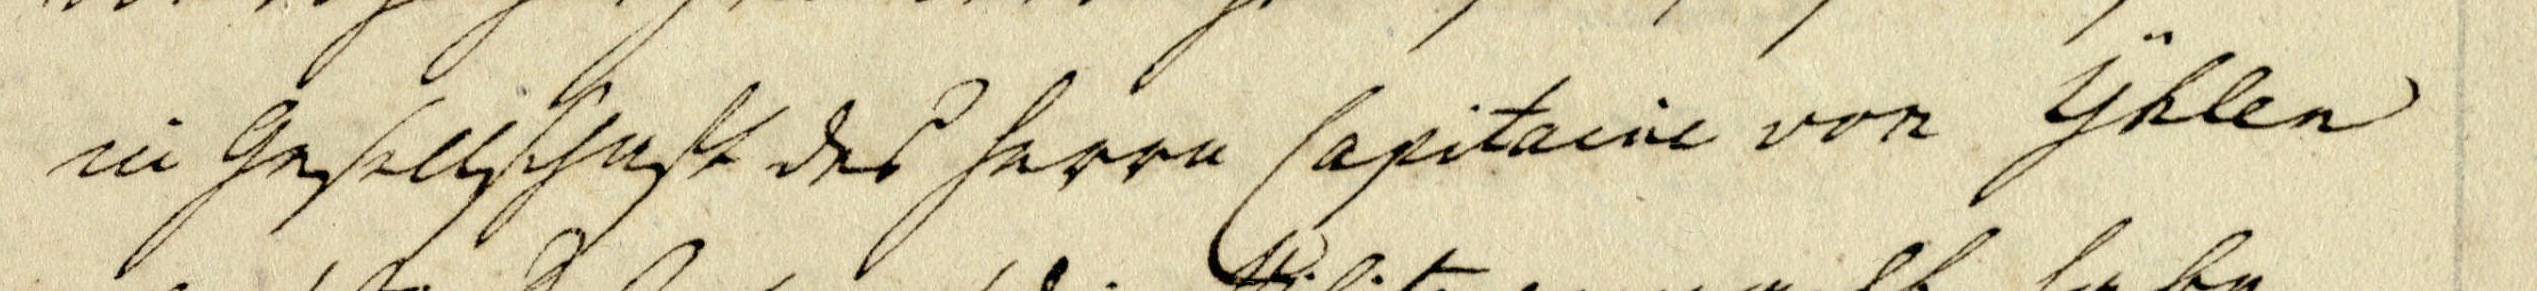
in Gesellschaft des Herrn Capitaine von Yhlen
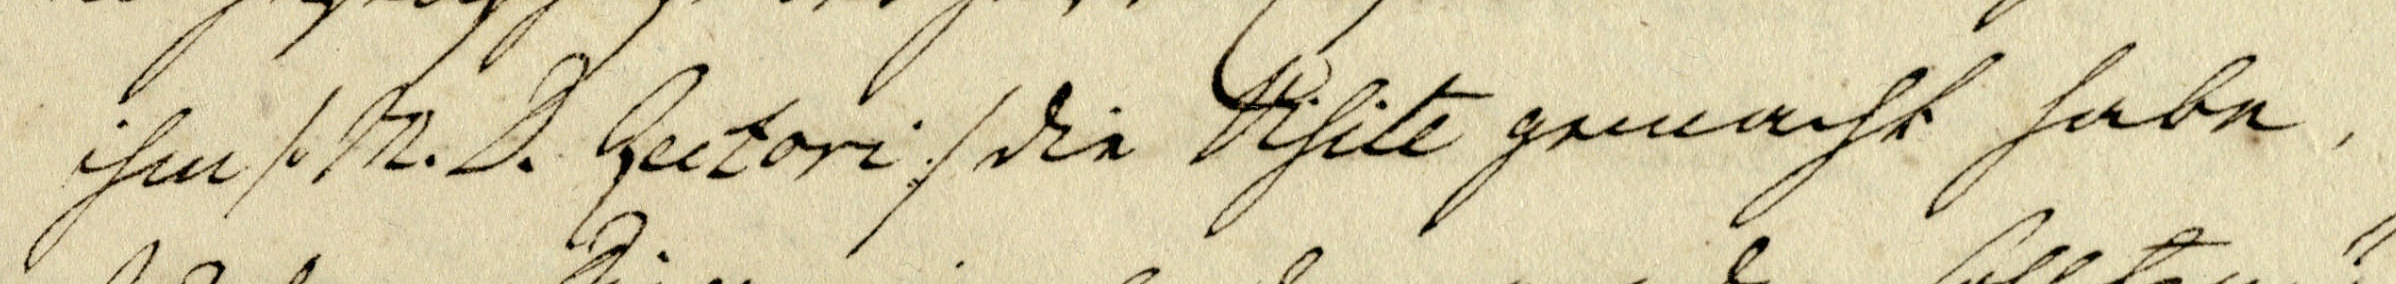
ihm /. M. D. Rectori :/ die Visite gemacht habe,
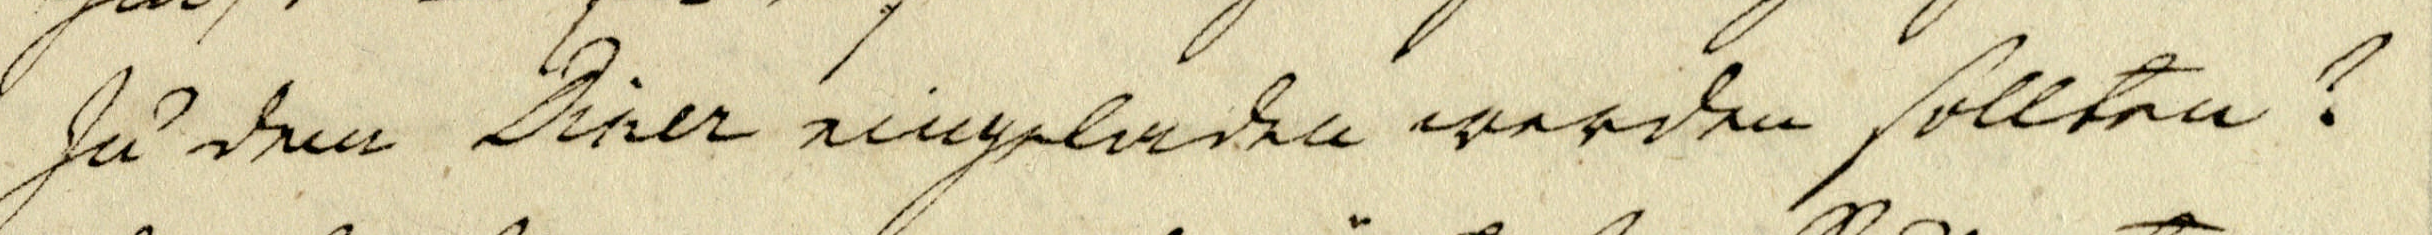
zu dem Diner eingeladen werden sollten?
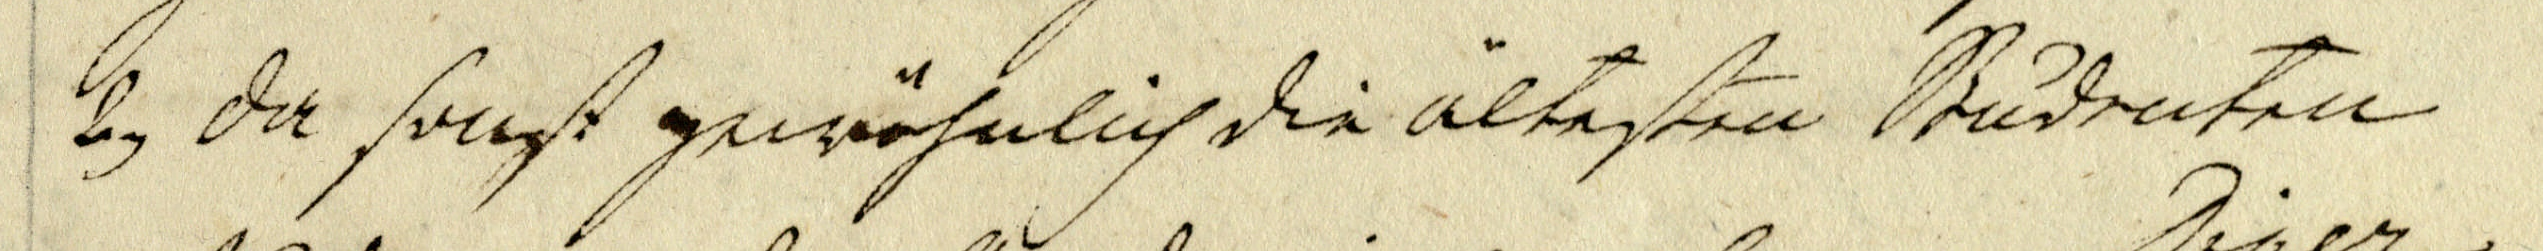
2., Da sonst gewöhnlich die ältesten Studenten
